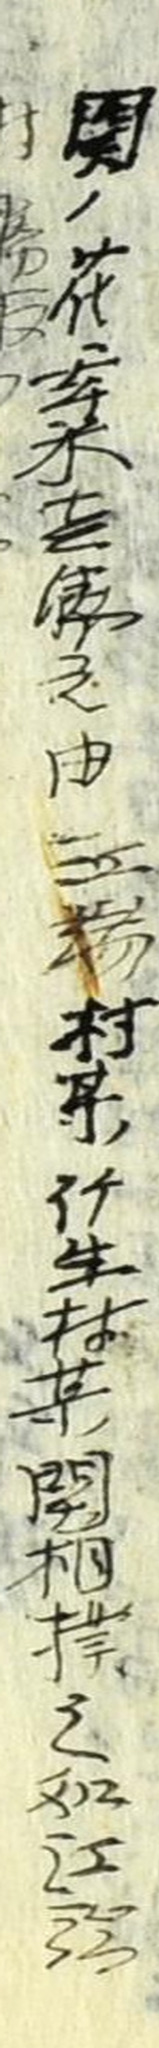関ノ花玄米壱俵之由江端村某竹生村某関相撲之処江端
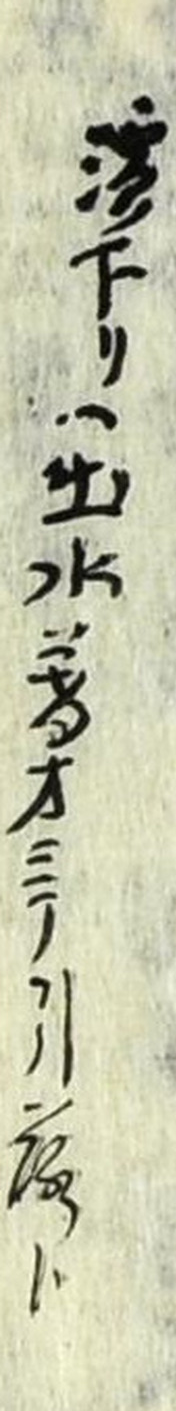浜下リへ出水暮方ニテ引落候
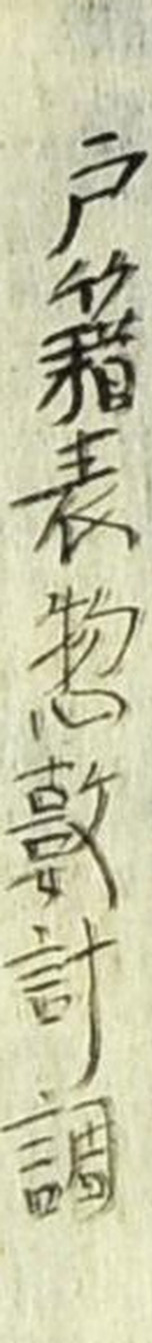戸籍表惣数計調
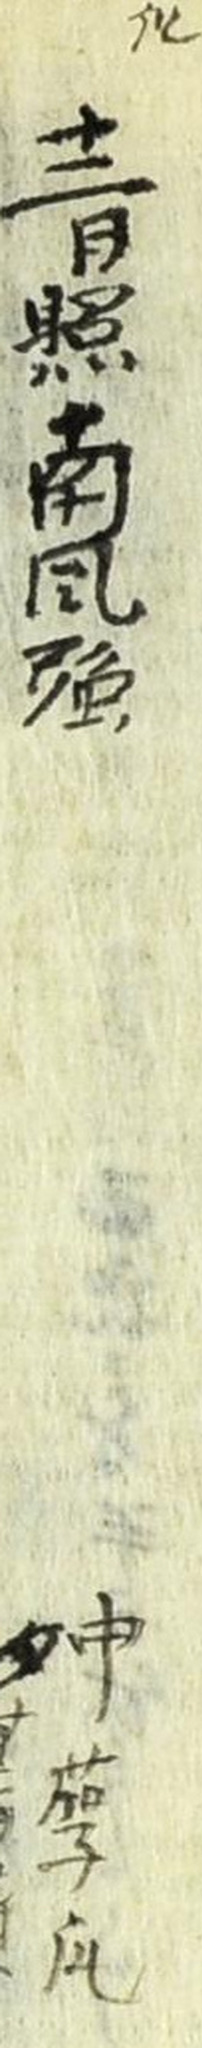十二日照南風強中茄子瓜
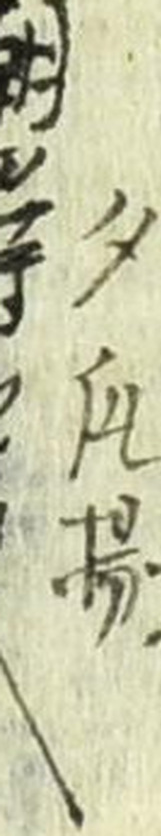夕瓜揚
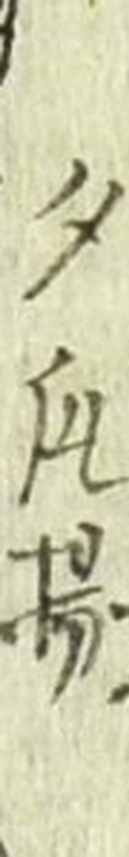夕瓜揚
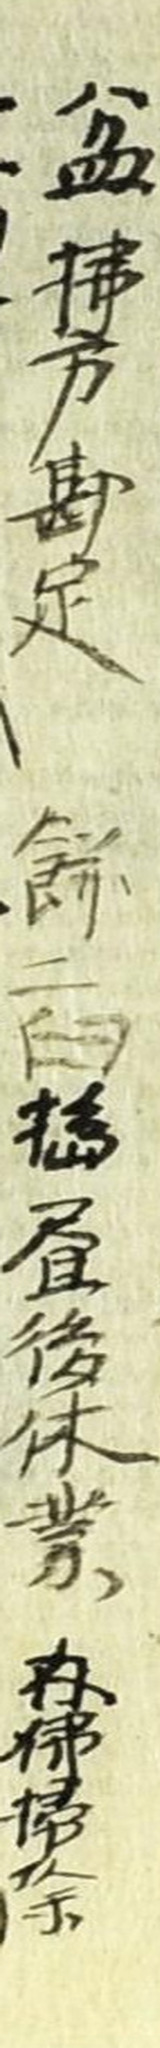盆払方勘定餅二臼搗昼後休業内仏掃除
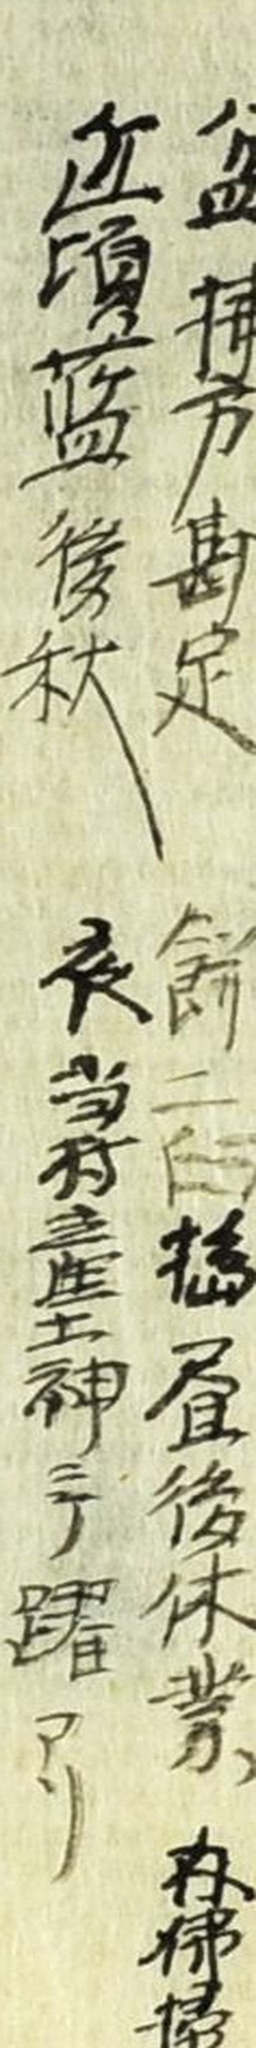近頃藍後秋夜当村産土神ニテ躍アリ
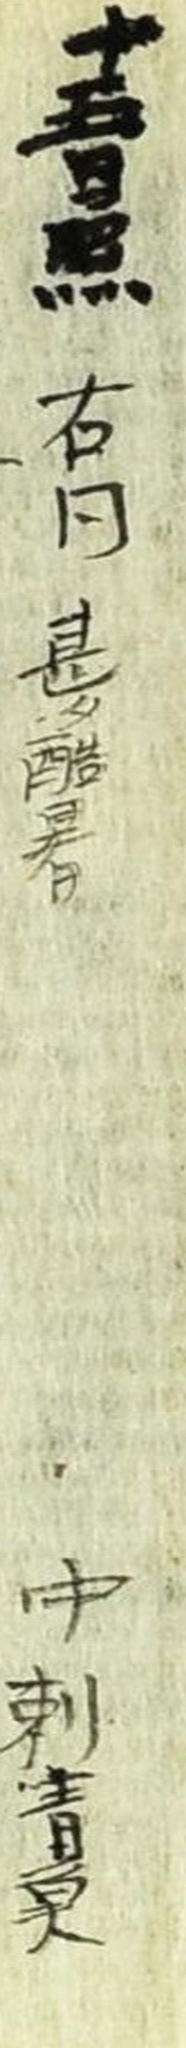○十五日照右同甚タ酷暑中刺青魚
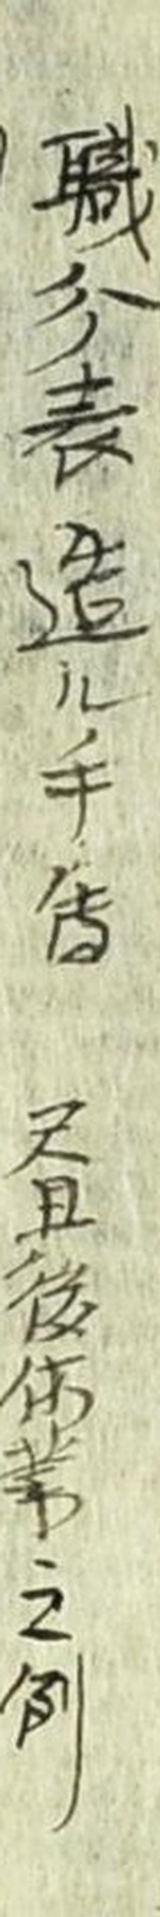職分表造ル手伝昼後休業之例
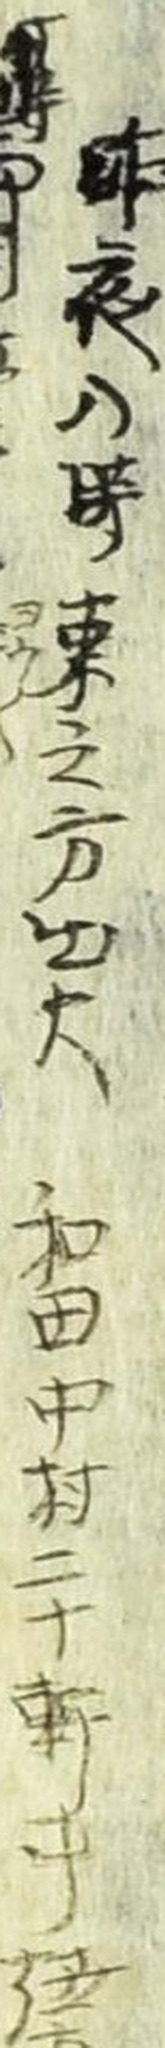昨夜八時東之方出火和田中村二十軒計焼失之由
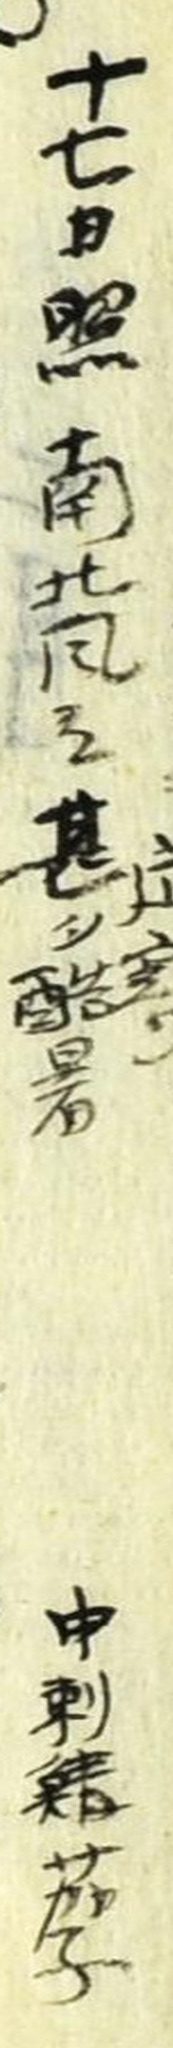○十七日照南北風有甚タ酷暑中刺鯖茄子
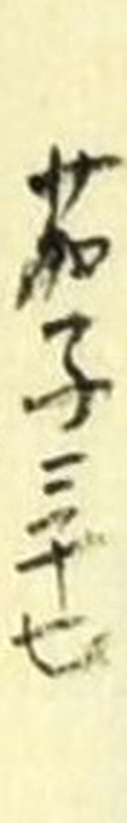茄子三十七
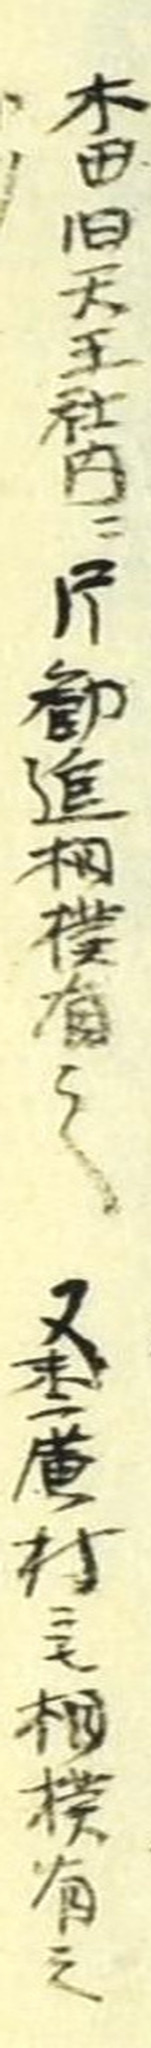木田旧天王社内ニ片勧進相撲有之又末広村ニモ相撲有之

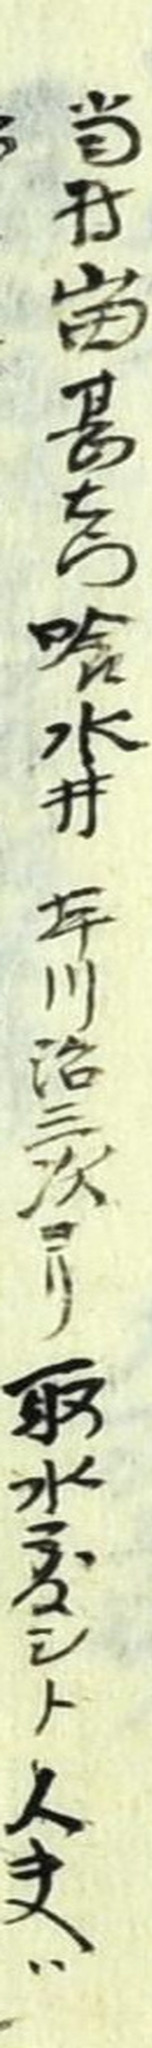当村山田甚右衛門喰水井坪川治三次ヨリ取水致シ候人夫ハ
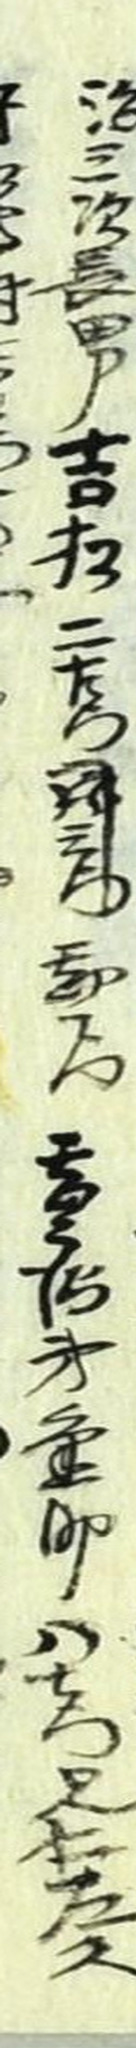治三次長男吉松二左衛門勘右衛門甚兵衛弟重助八右衛門兄仁左久
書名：（日記）
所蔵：福井県文書館 Fukui Prefectural Archives
